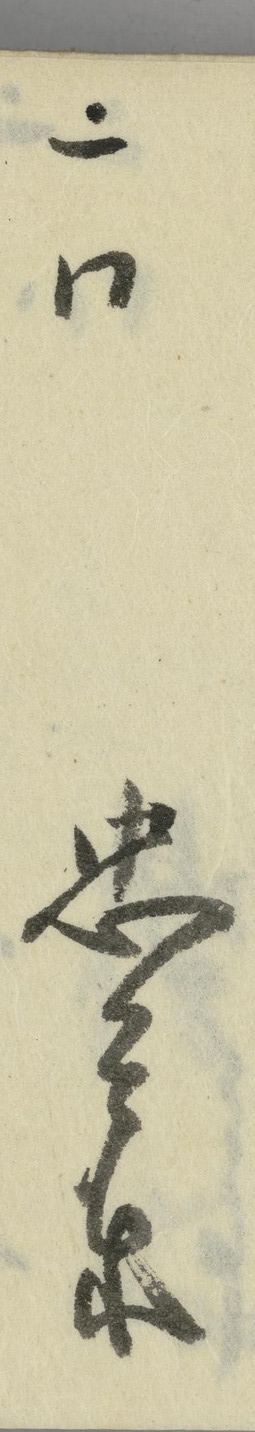一同市兵衛
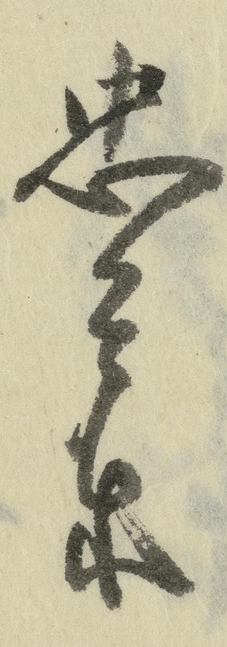嘉兵衛
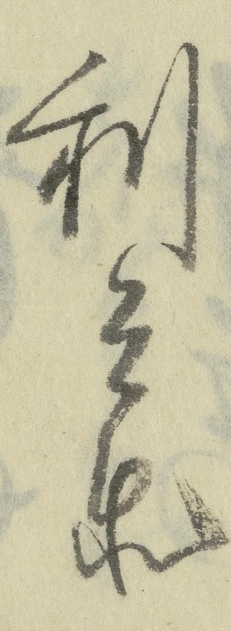嘉兵衛
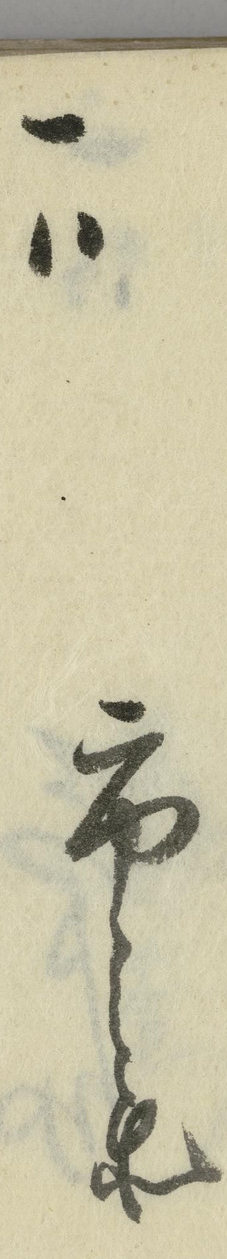一同市兵衛
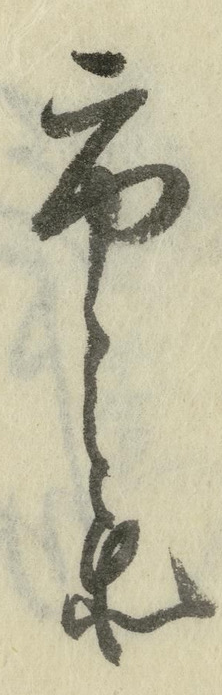嘉兵衛
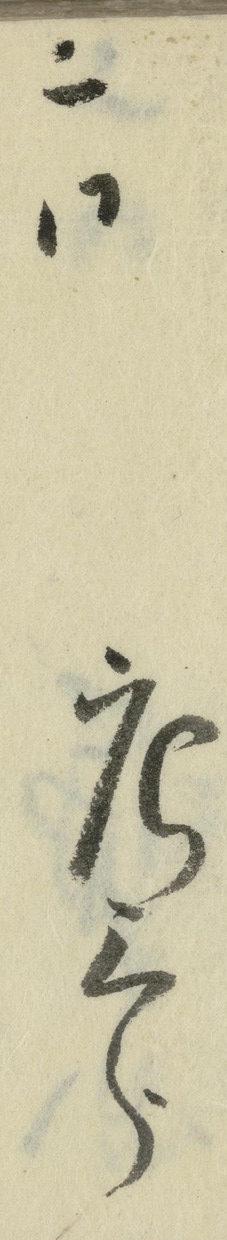一同庄三郎
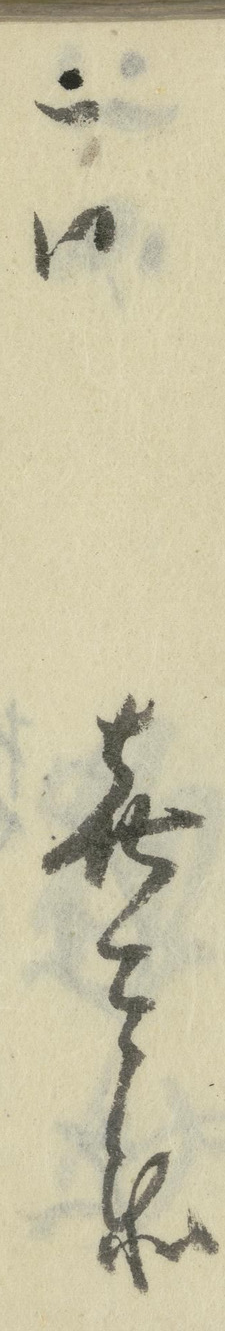一同喜兵衛
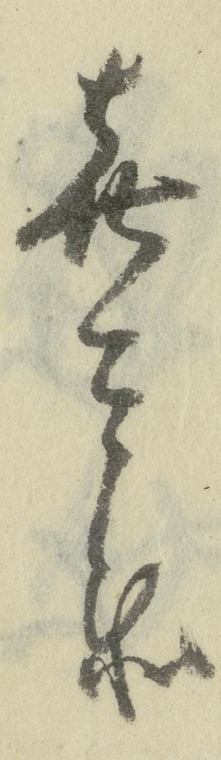嘉兵衛
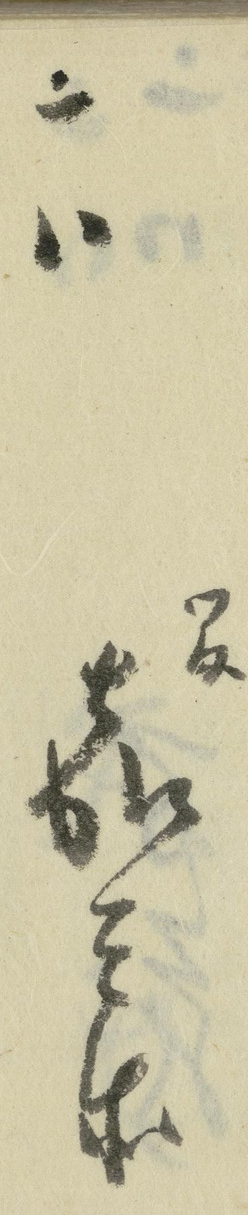一同市兵衛
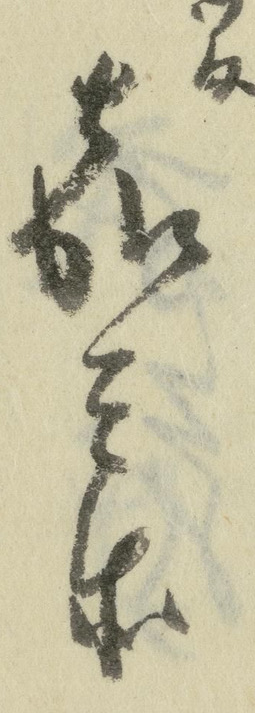嘉兵衛
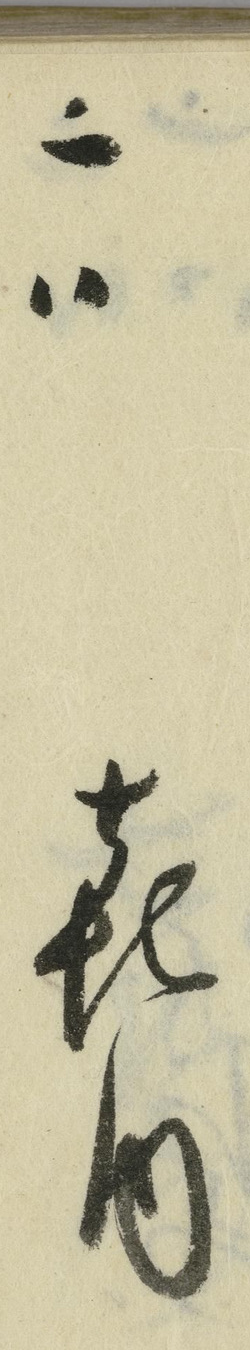一同喜内

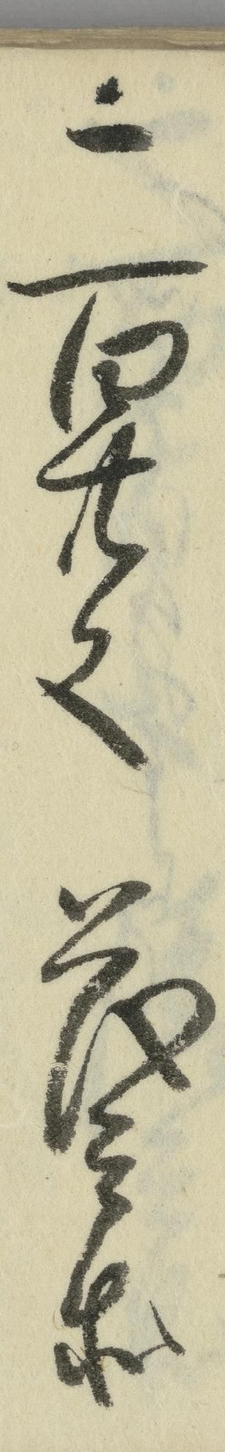一百廿文茂兵衛
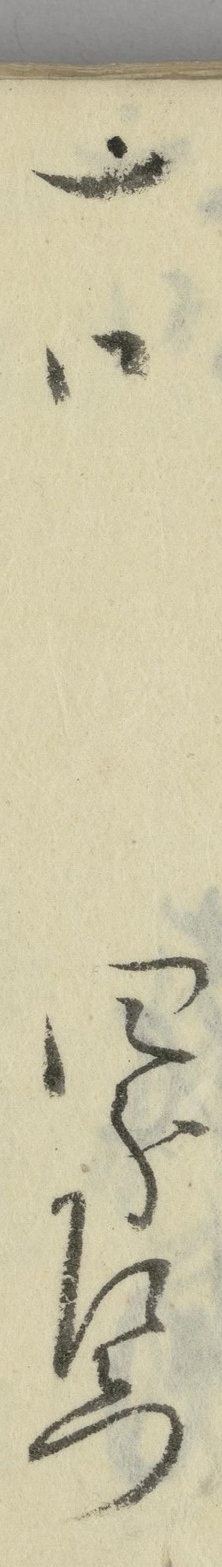一同四郎左衛門
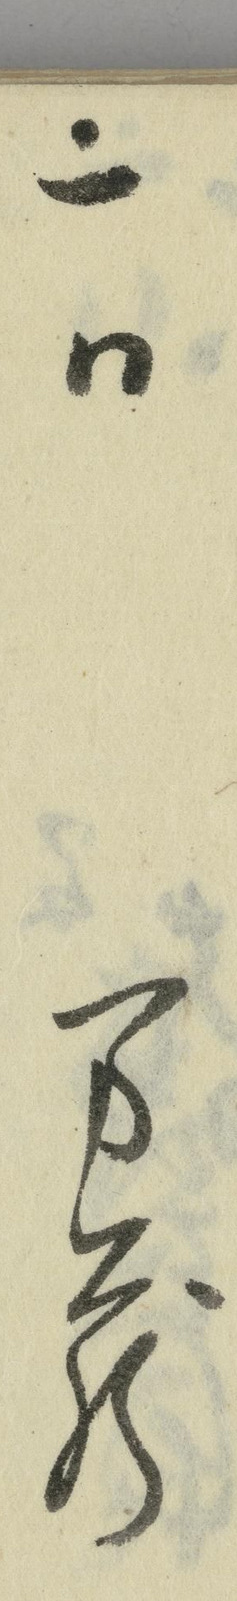一同万蔵
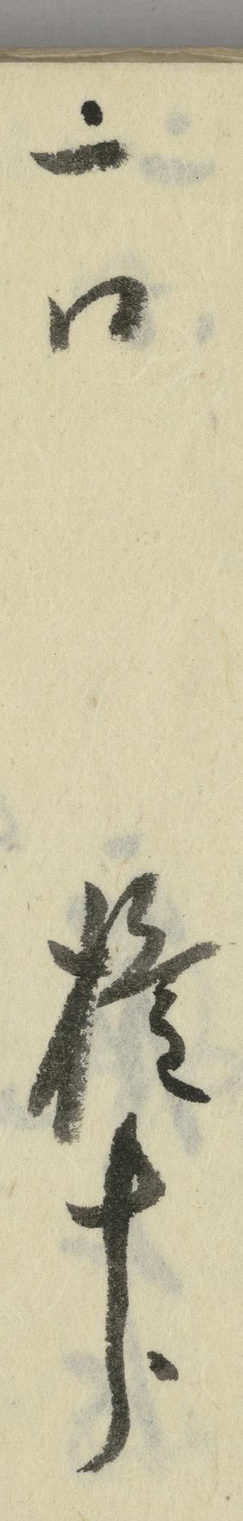一同権十郎
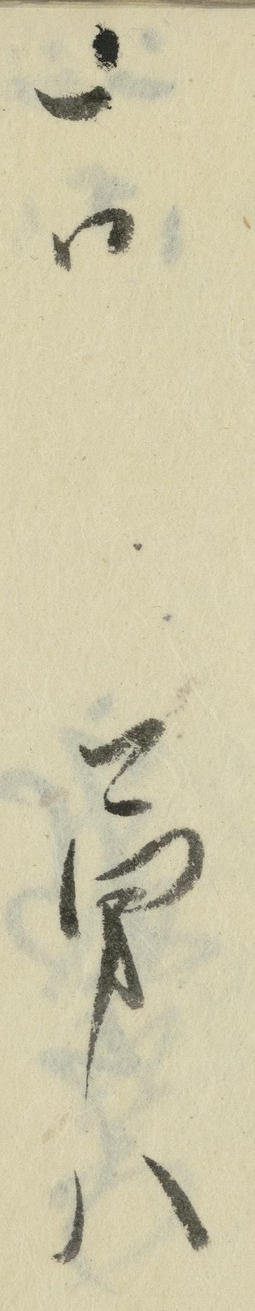一同勇八
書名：天明淺間噴火ニ関スル書類
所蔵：東京大学地震研究所図書室 Earthquake Research Institute Library, The University of Tokyo, JAPAN
